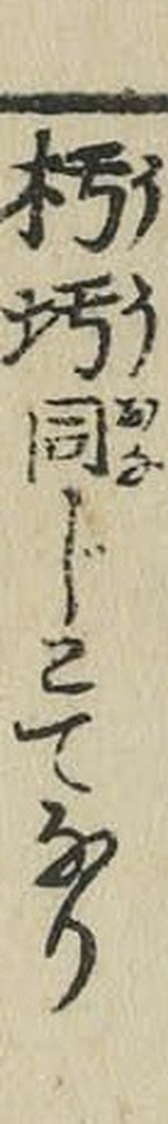𣏓圬同じこてなり
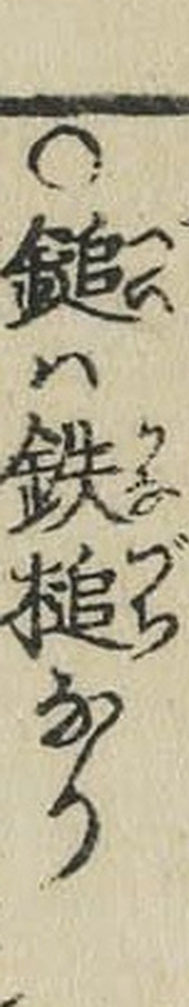○鎚は鉄槌なり
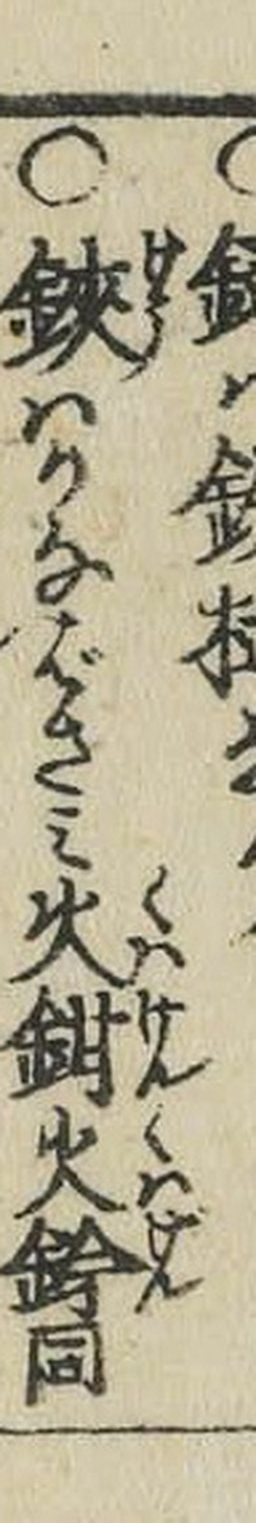○鋏はかなばさみ火鉗火鈐同
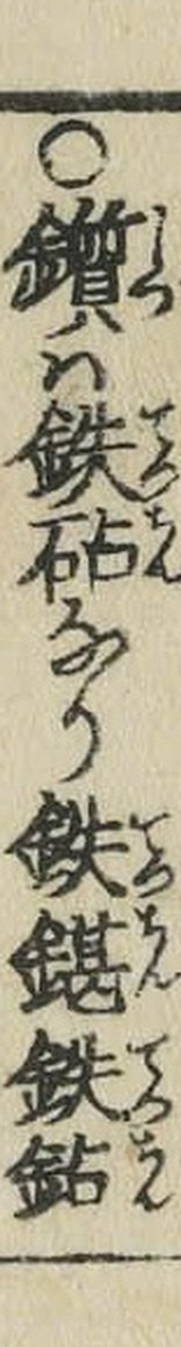○鑕は鉄砧なり鉄鍖鉄鉆
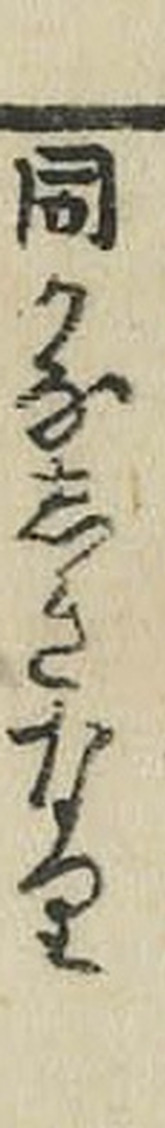同かなしきなり
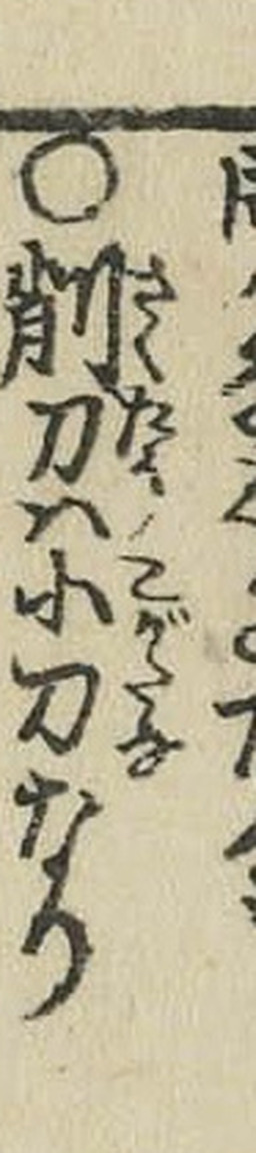○削刀は小刀なり
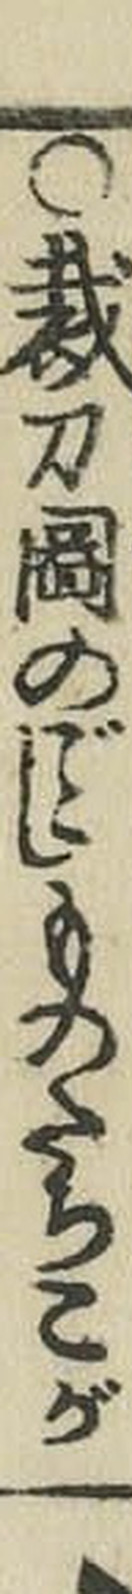○裁刀図のごとしものたちこが
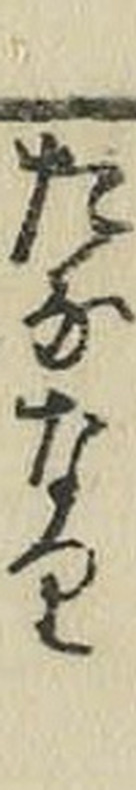たななり
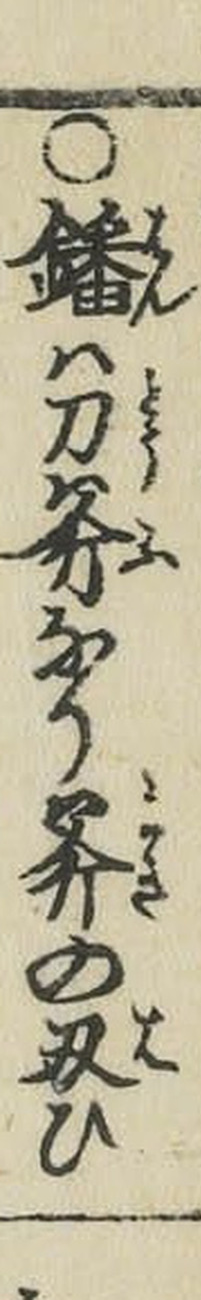○鐇は刀斧なり斧の刃ひ
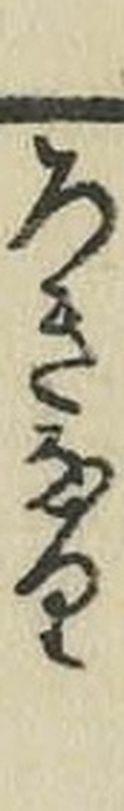ろきなり
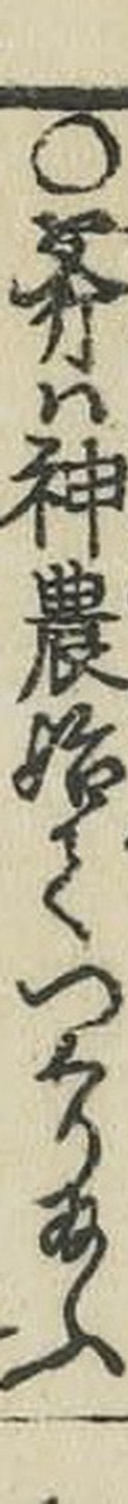○斧は神農始てつくり給ふ
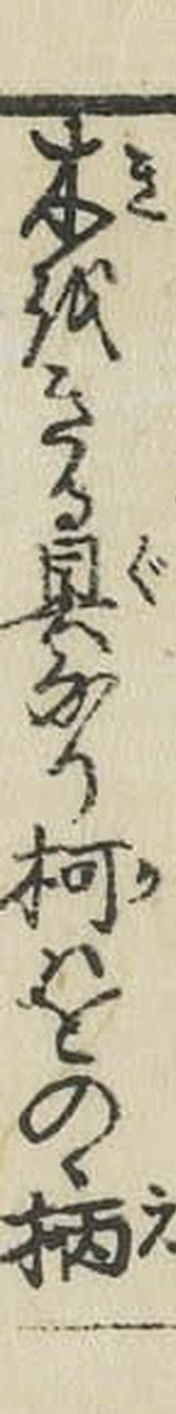木をきる具なり柯はをのゝ柄
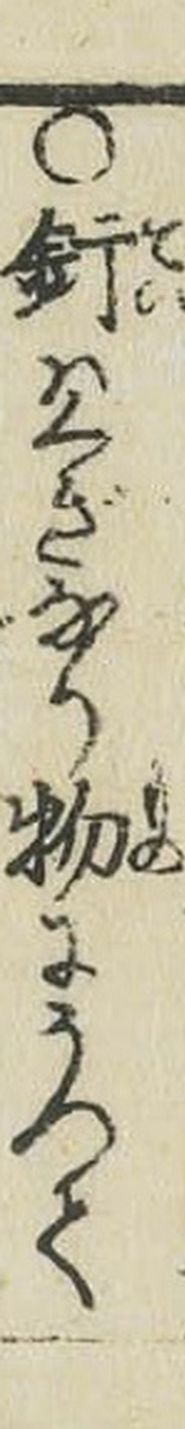○釘はくぎなり物にうつて
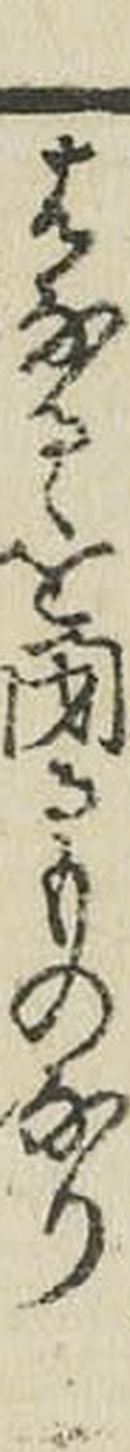はなるゝを閉るものなり
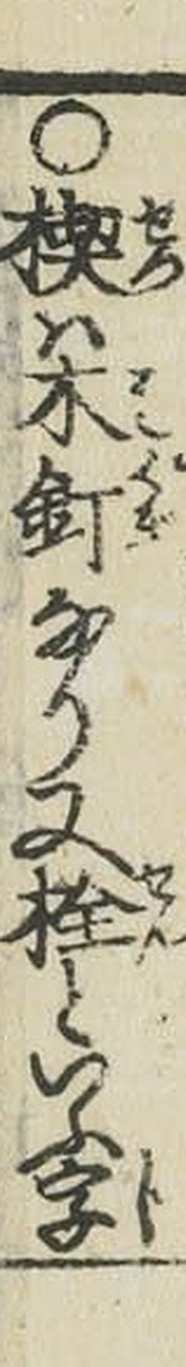○楔は木釘なり又栓といふ字
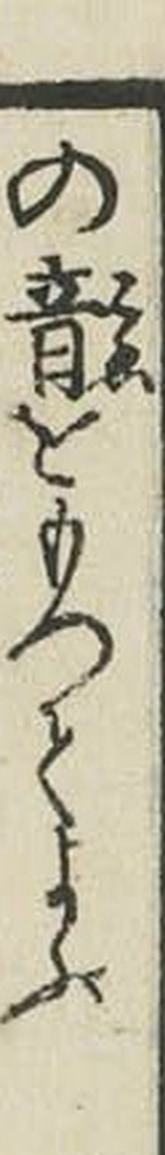の音をもつてよぶ
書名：増補頭書訓蒙図彙大成 10巻 5:巻之9-11
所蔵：東京学芸大学教育コンテンツアーカイブ
